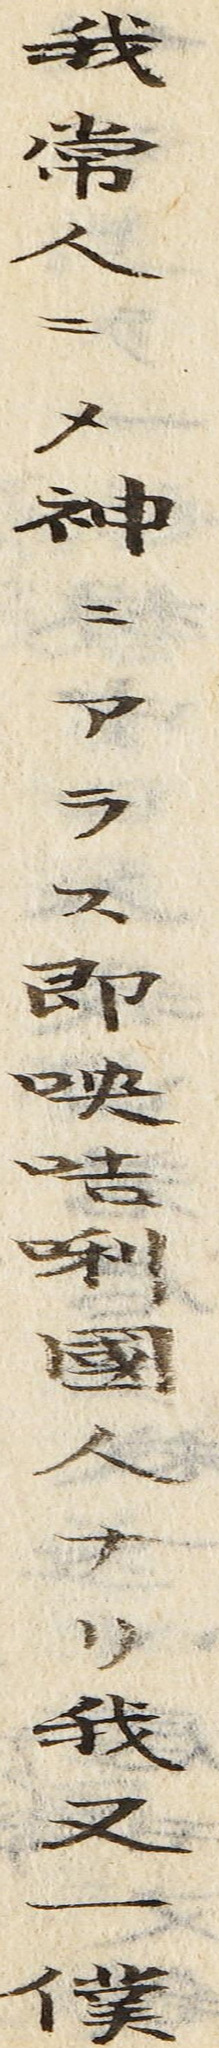我常人ニシテ神ニアラス即咉咭唎国人ナリ我又一僕
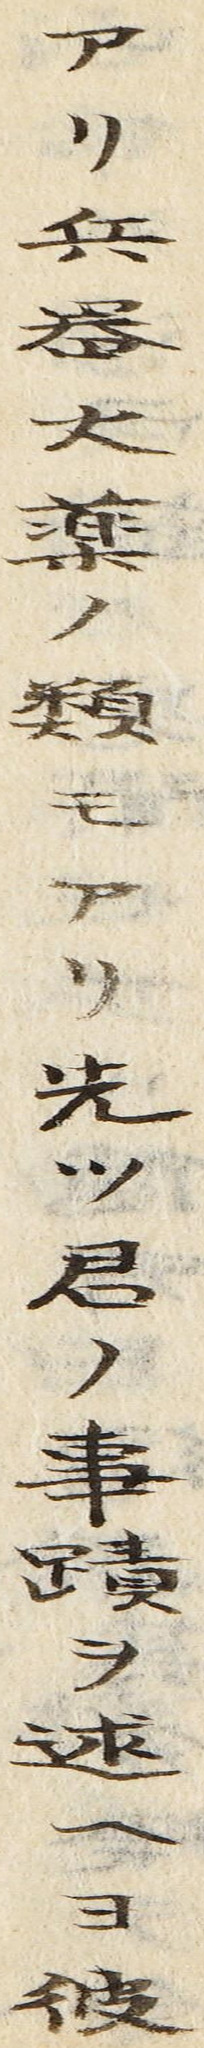アリ兵器火薬ノ類モアリ先ツ君ノ事蹟ヲ述ヘヨ彼
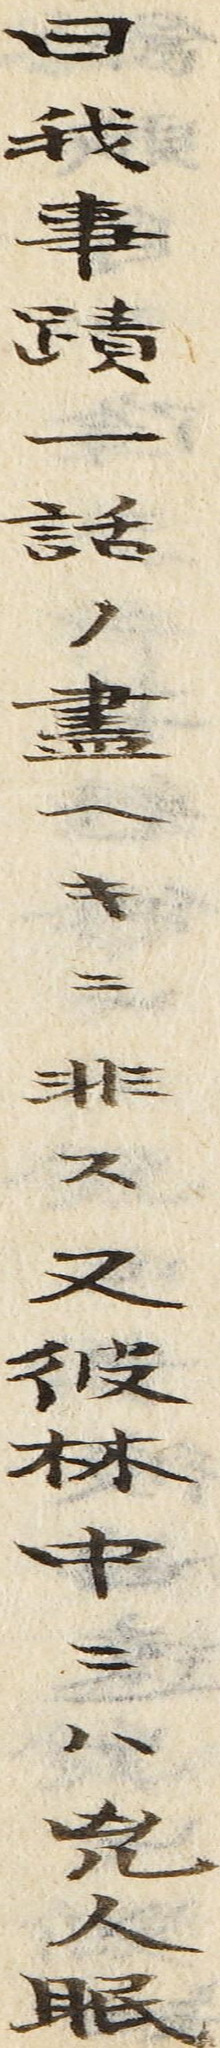曰我事蹟一話ノ尽ヘキニ非ス又彼林中ニハ兇人眠
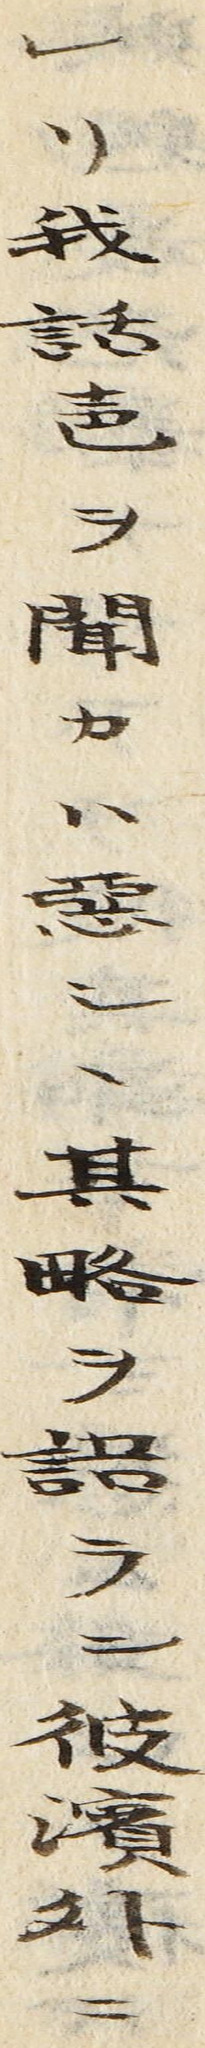レリ我話声ヲ聞カハ悪シヽ其略ヲ語ラン彼浜外ニ
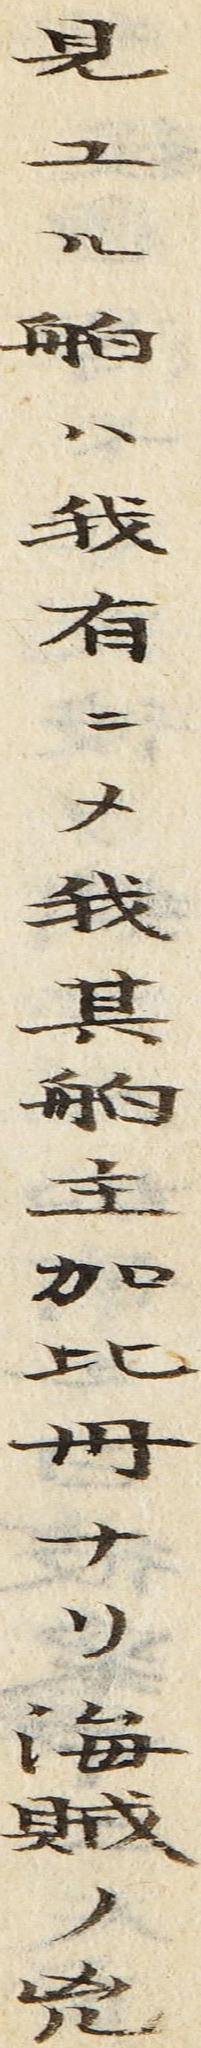見ユル舶ハ我有ニシテ我其舶主加比丹ナリ海賊ノ兇
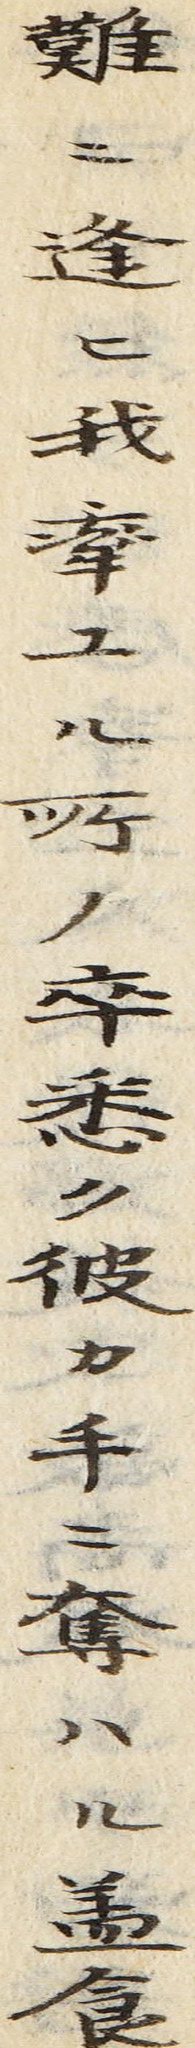難ニ逢ヒ我率ユル所ノ卒悉ク彼カ手ニ奪ハル盖食
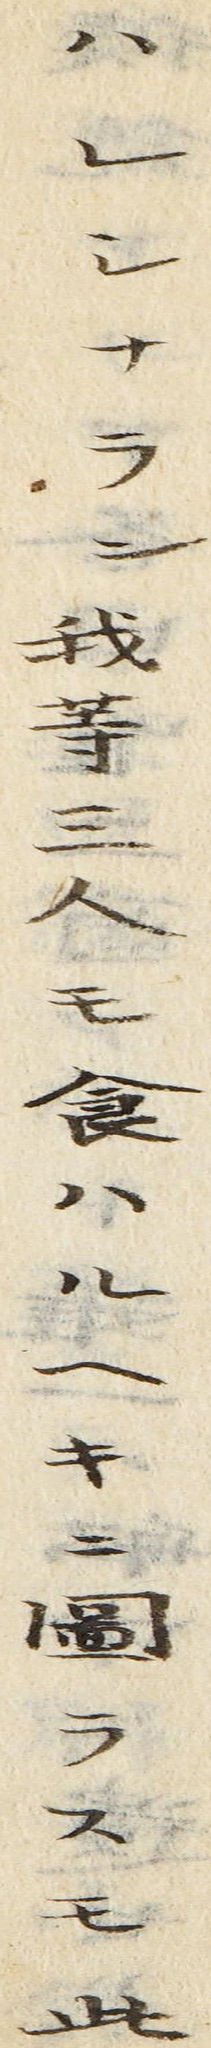ハレシナラン我等三人モ食ハルヘキニ図ラスモ此
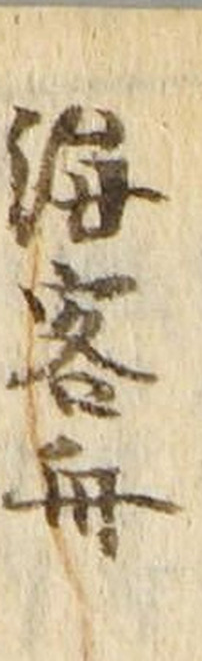海客舟
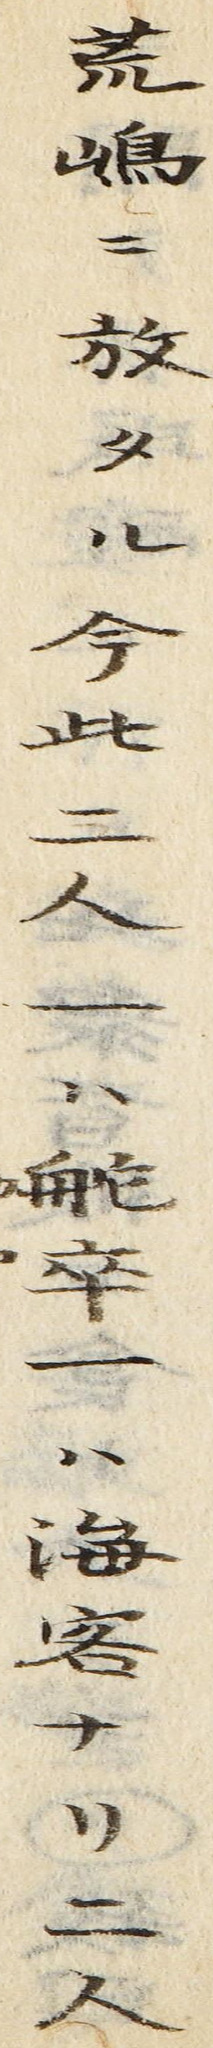荒嶋ニ放タル今此二人一ハ舵卒一ハ海客ナリ二人
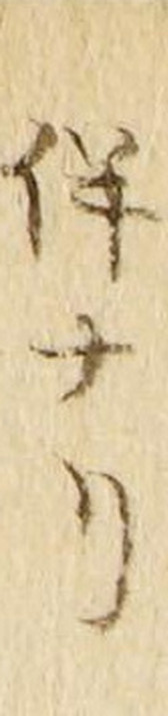伴ナリ
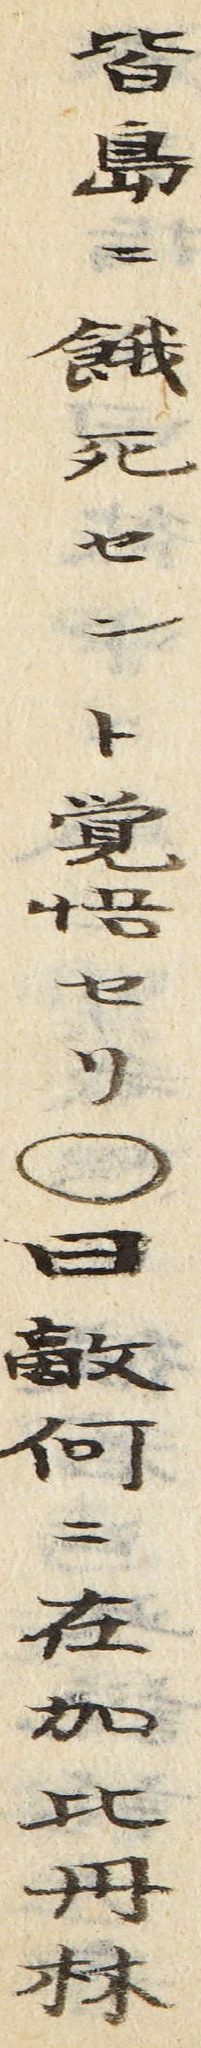皆島ニ餓死セント覚悟セリ◯曰敵何ニ在加比丹林

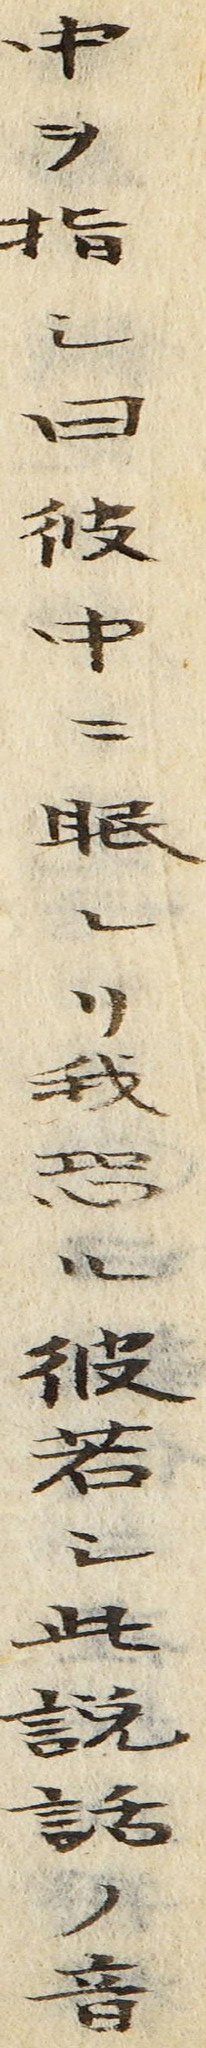中ヲ指シ曰彼中ニ眠レリ我恐ル彼若シ此説話ノ音
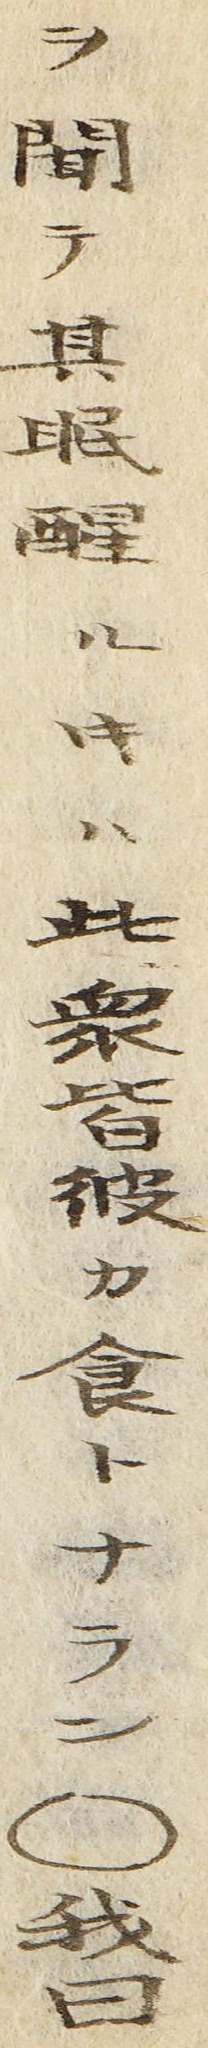ヲ聞テ其眠醒ルトキハ此衆皆彼カ食トナラン◯我曰
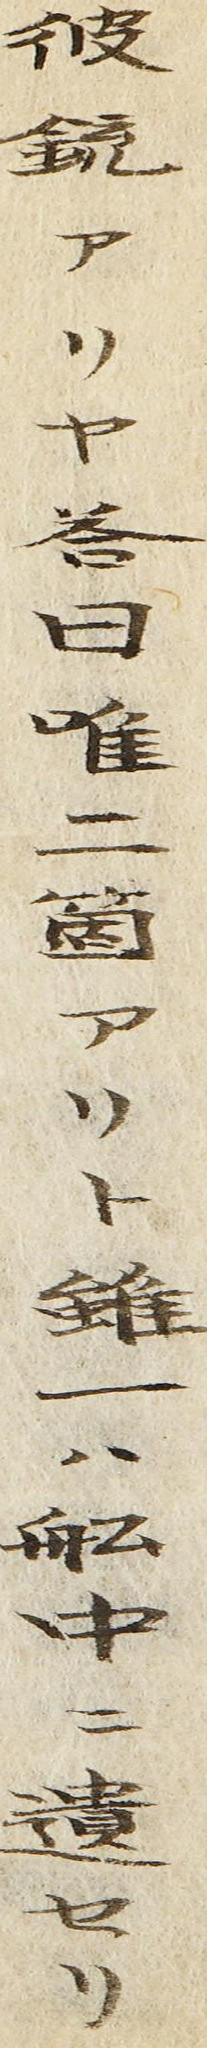彼銃アリヤ答曰唯二箇アリト雖一ハ船中ニ遺セリ
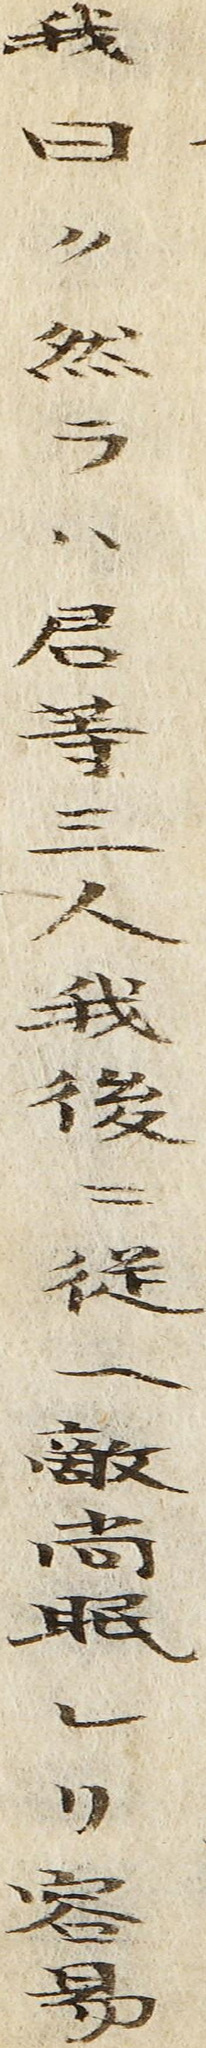我曰ク然ラハ君等三人後ニ従ヘ敵尚眠レリ容易
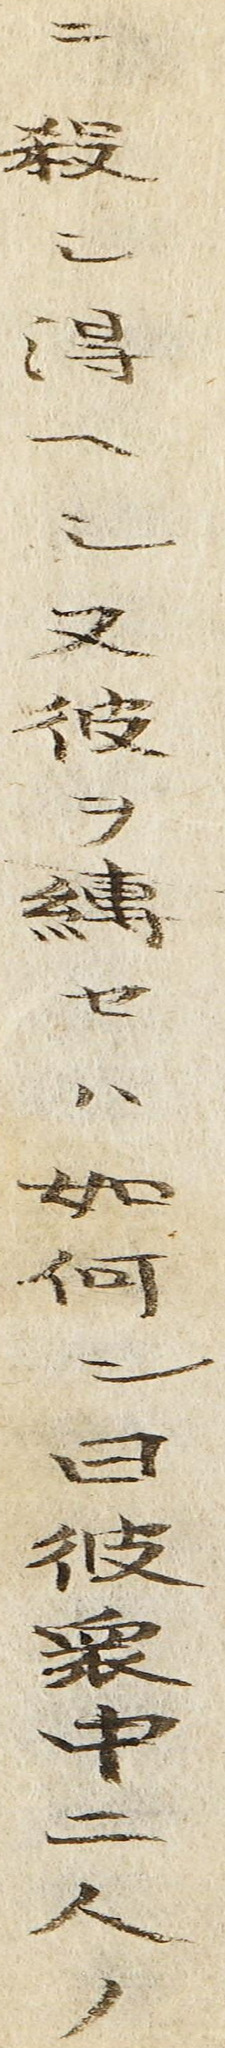ニ殺シ得ヘシ又彼ヲ縛セハ如何ン曰彼衆中二人ノ
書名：漂流紀事
